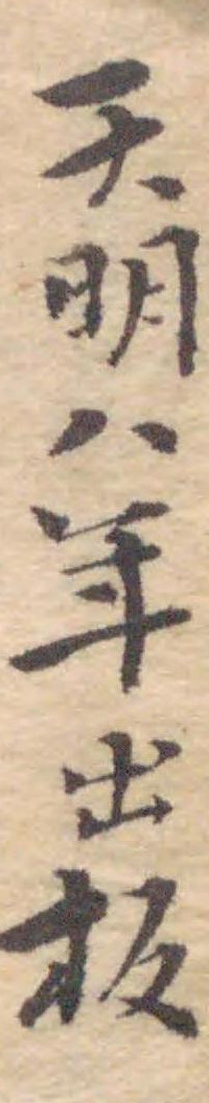天明八年出板
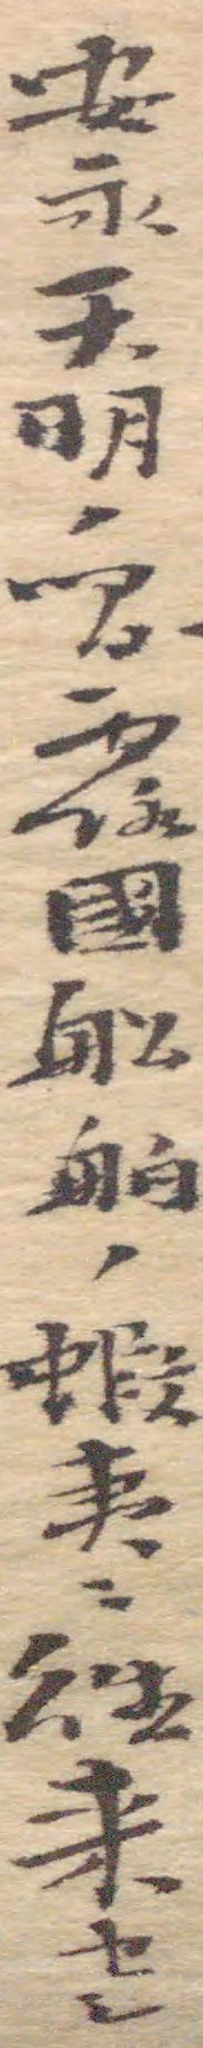安永天明の間露国船舶の蝦夷に往来せし
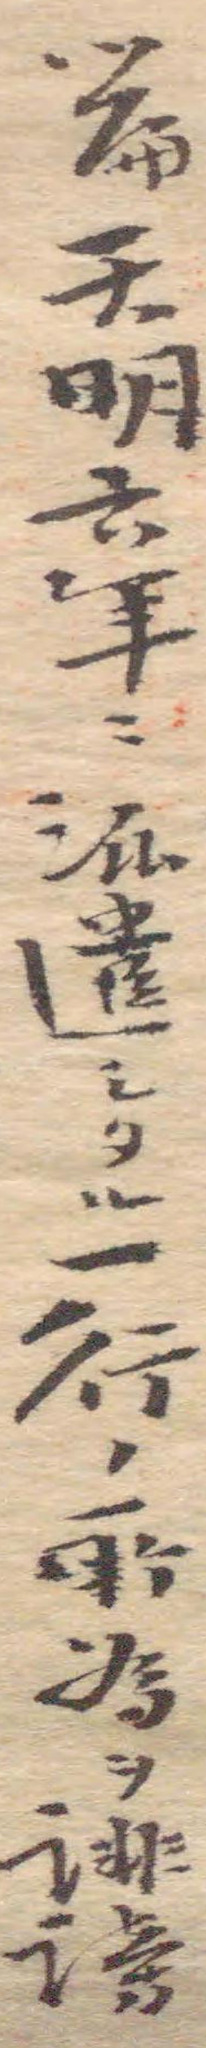篇天明六年に派遣したる一行の所為を誹謗

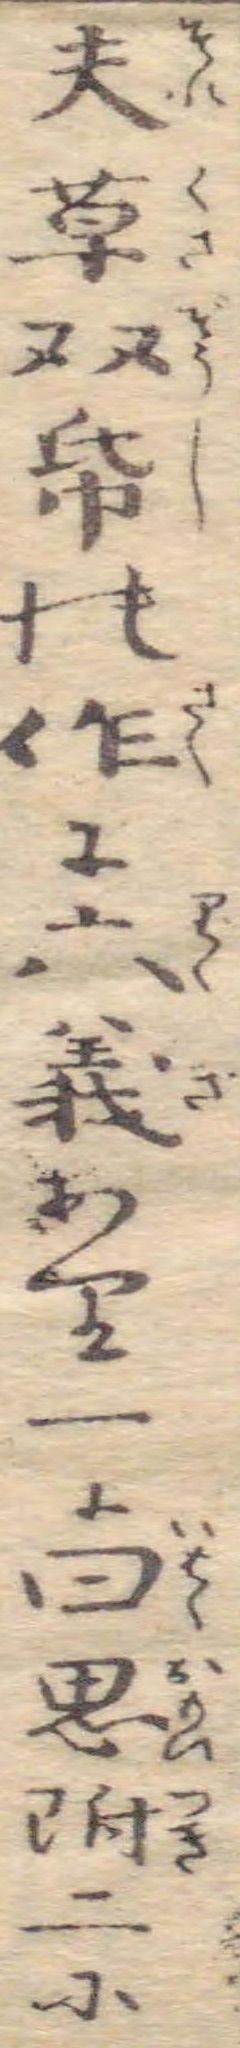夫草双紙の作に六義あり一に曰思附二に
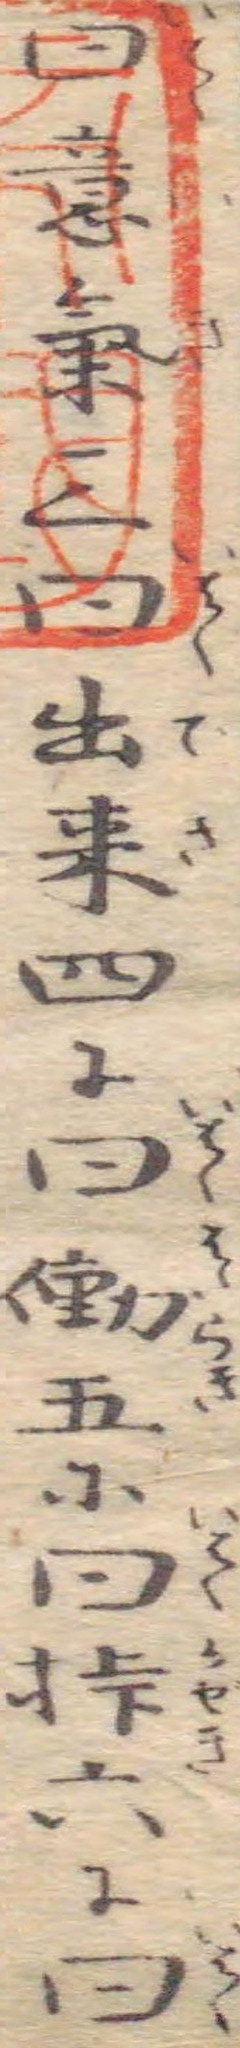曰意気三曰出来四に曰働五に曰桛六に曰
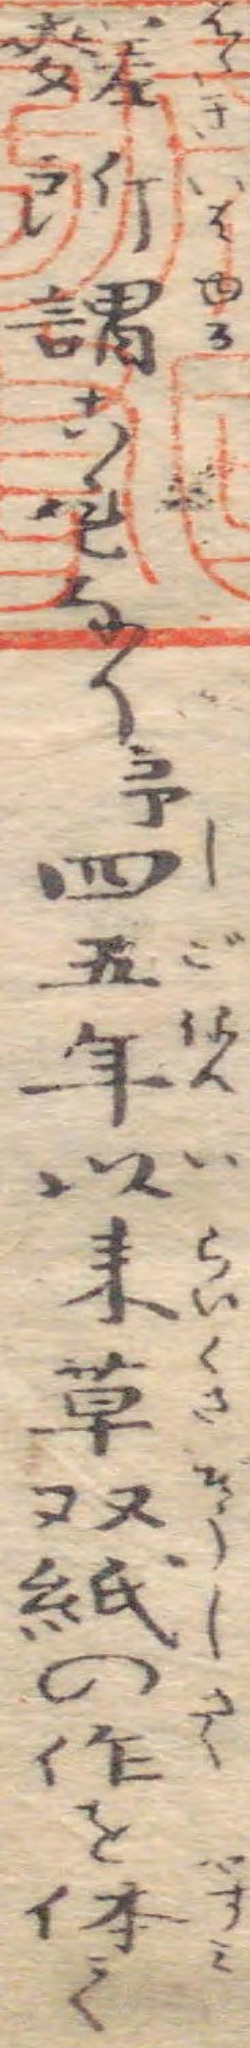䴾所謂これなり予四五年以来草双紙の作を休て
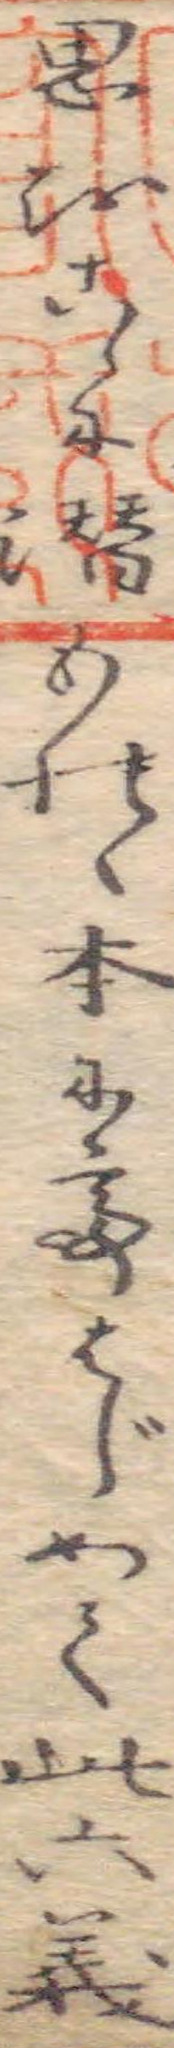思をこゝに潜ものゝ本にてはじめて此六義
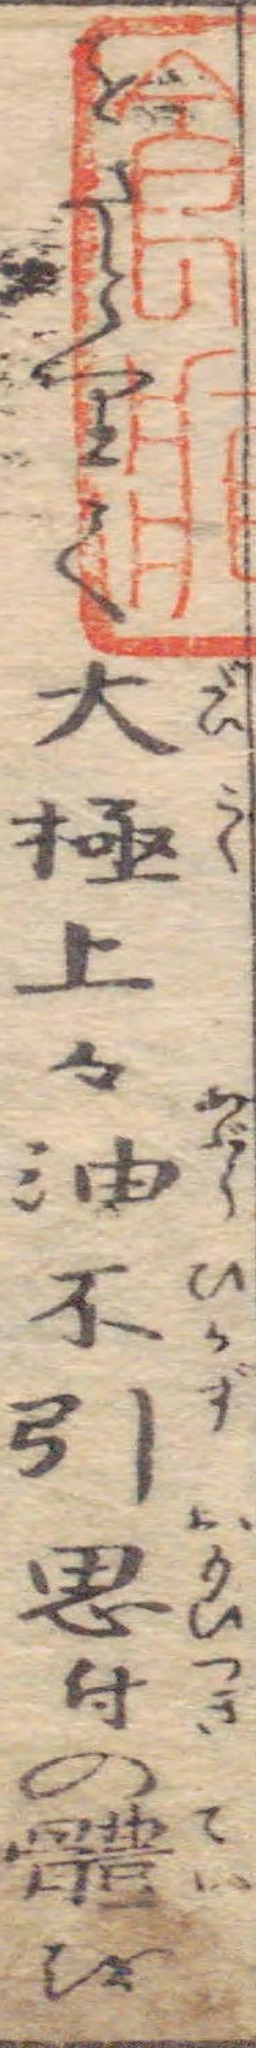をさとりて大極上々油不引思付の体を

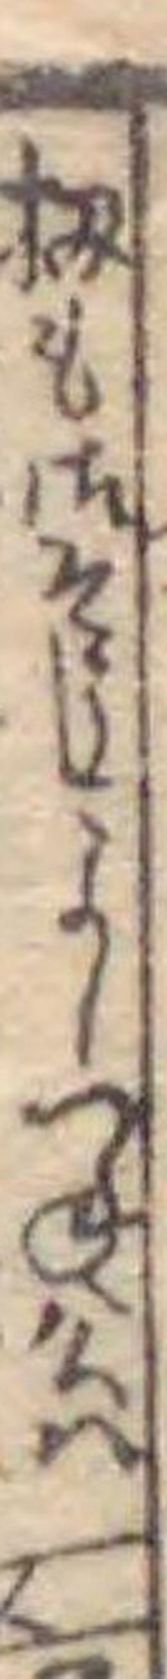扨も御そうしよしつね公は
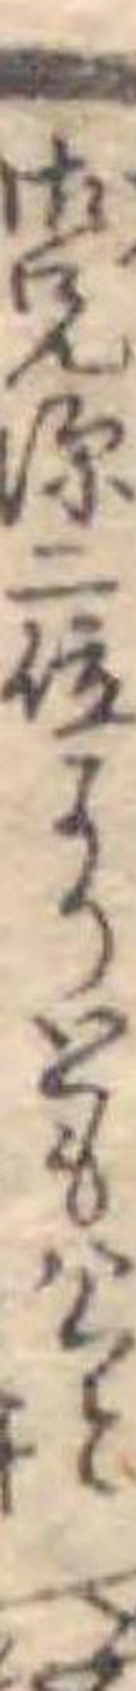御兄源二位よりとも公と
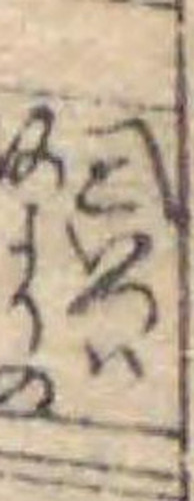〽こいつは
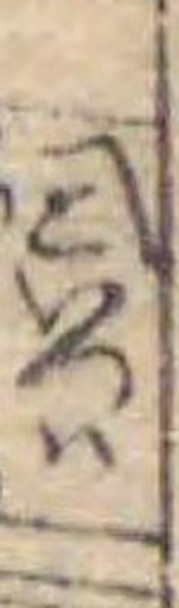〽こいつは
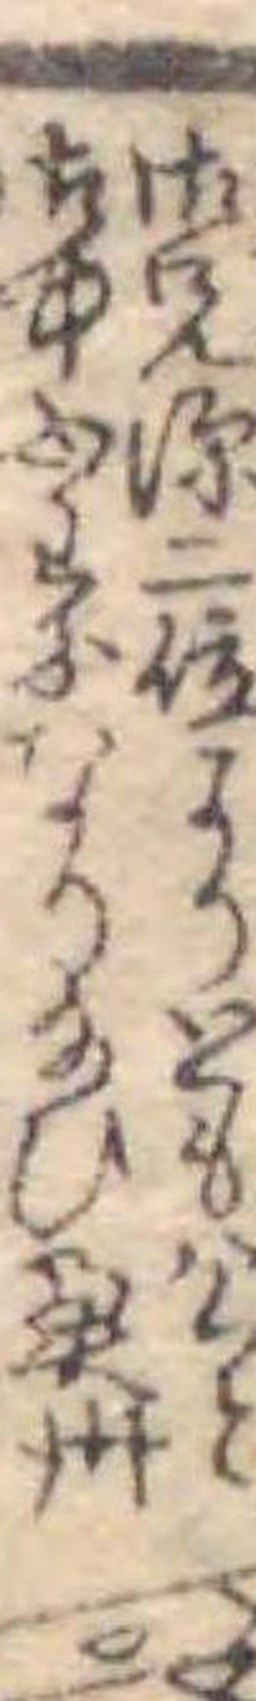御中ふわになり給ひ奥州
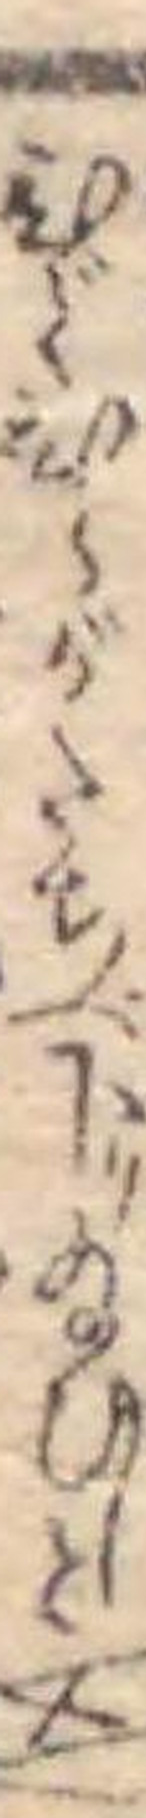ひでひらがたちへ下り給ひしと
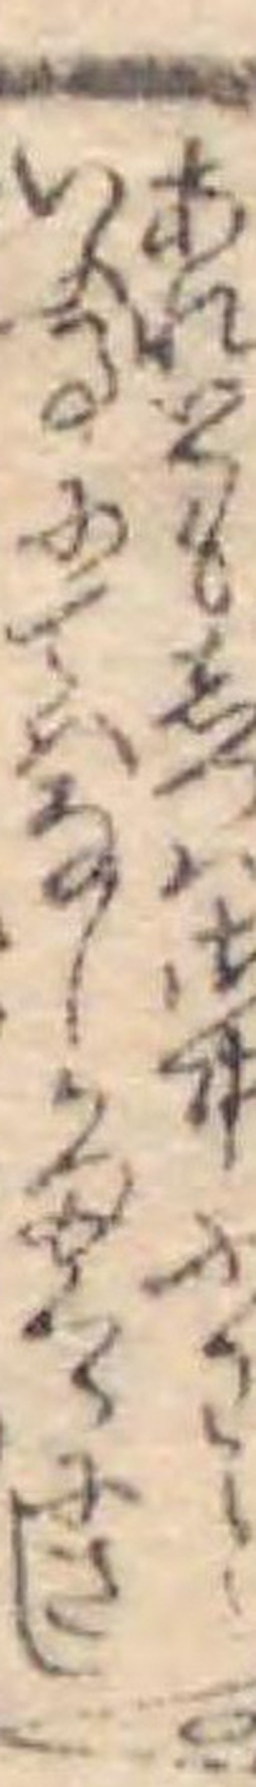いふ事にてはなしかまくらにさし
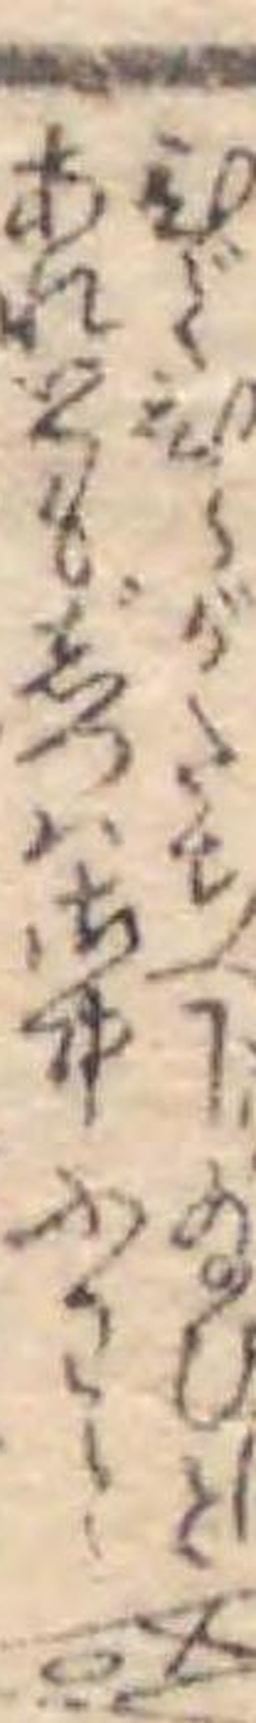あれともじつは御中ふわと
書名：悦贔負蝦夷押領 : 3巻
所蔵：国立国会図書館 National Diet Library, JAPAN
